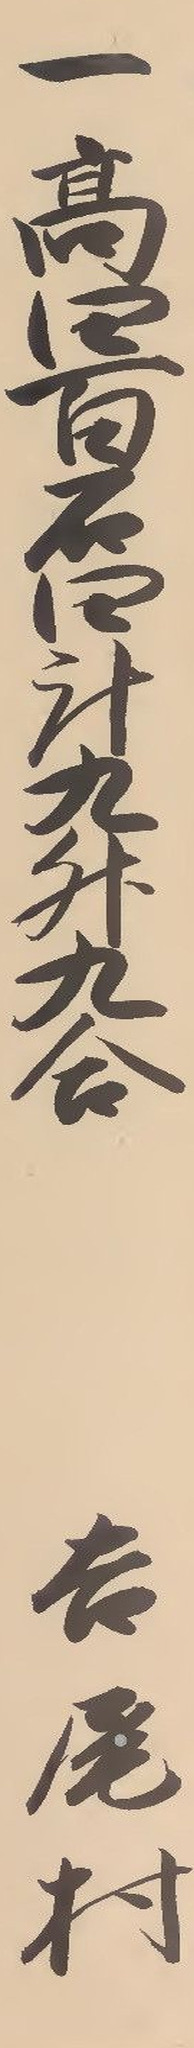一高四百石四斗九升九合吉尾村
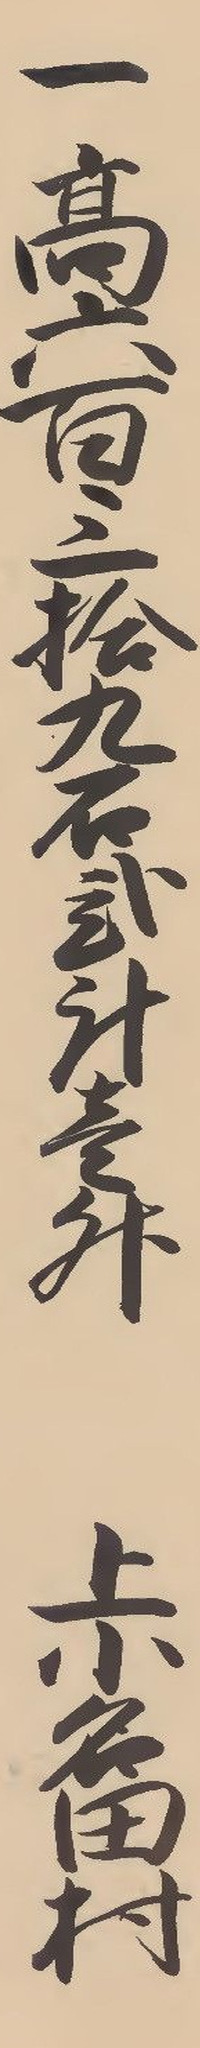一高六百三拾九石弐斗壱升上小名田村
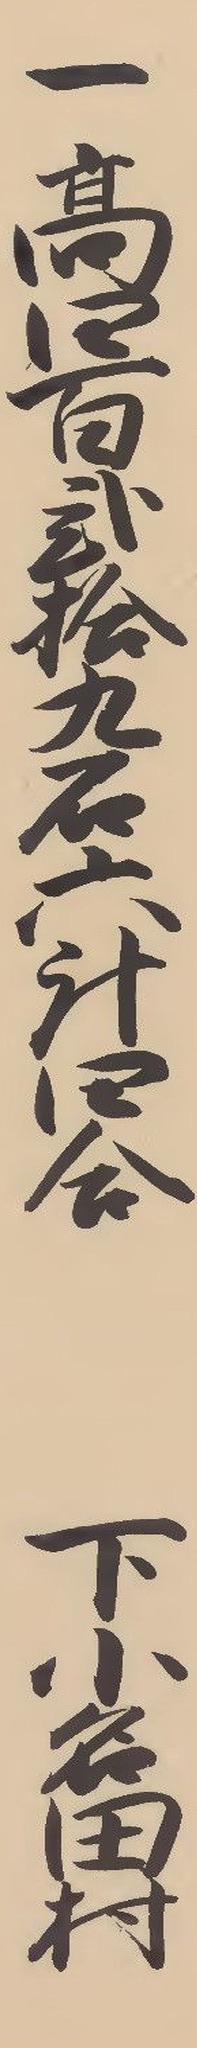一高四百弐拾九石六斗四合下小名田村
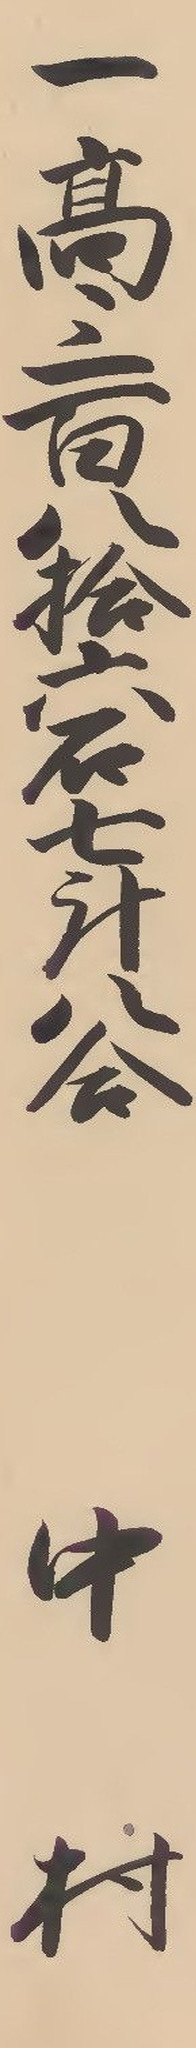一高三百八拾六石七斗八合中村

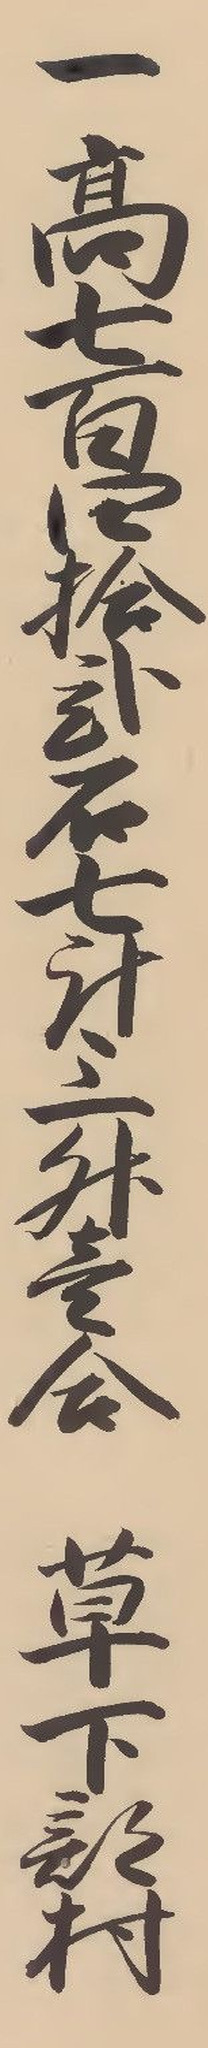一高七百四拾弐石七斗三升壱合草下部村
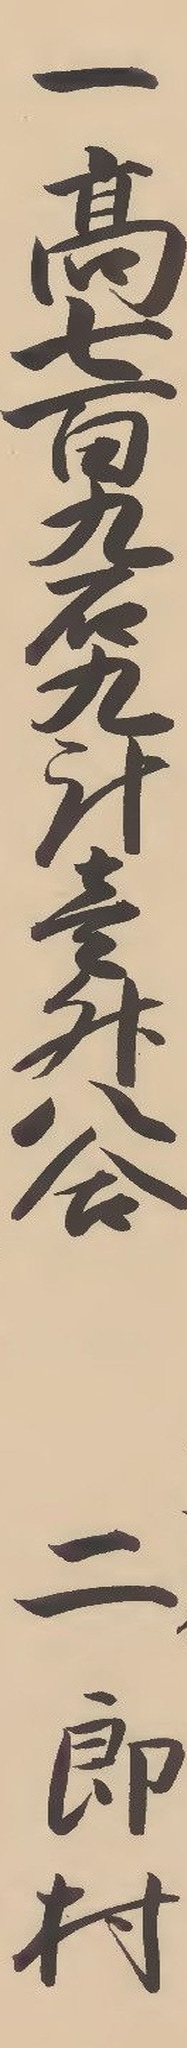一高七百九石九斗壱升八合二郎村
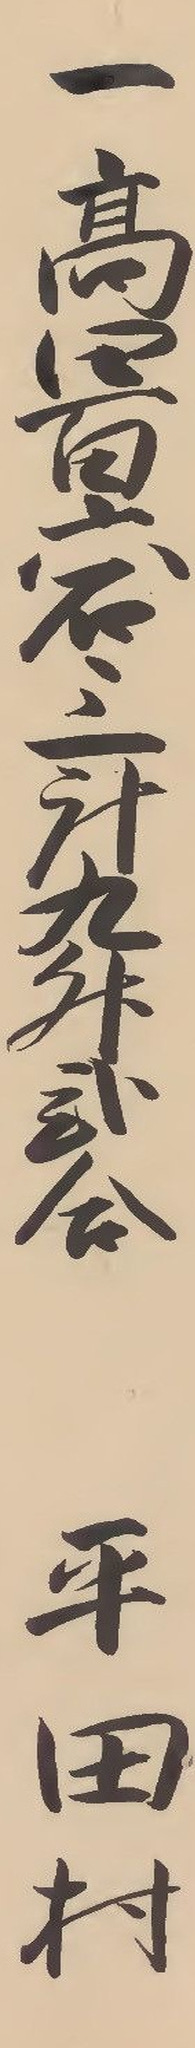一高四百六石三斗九升弐合平田村
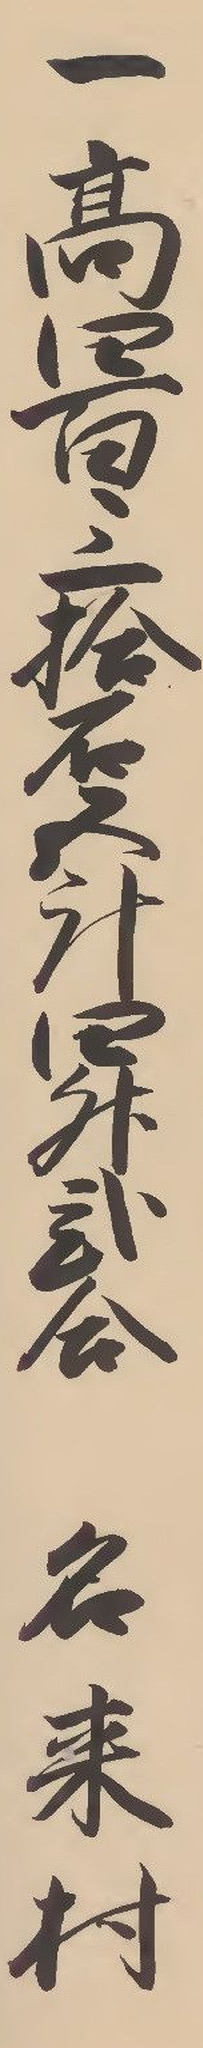一高四百三拾石五斗四升弐合名来村
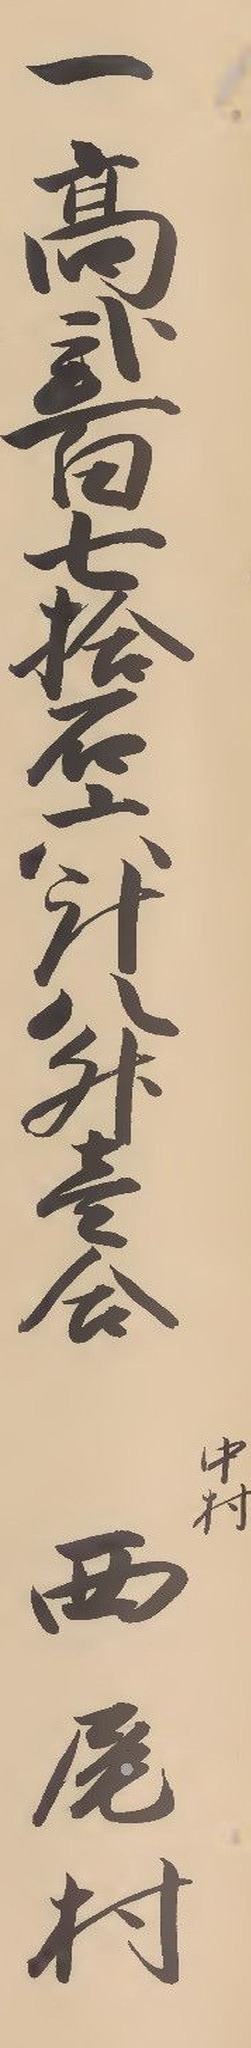一高弐百七拾石六斗八升壱合西尾村
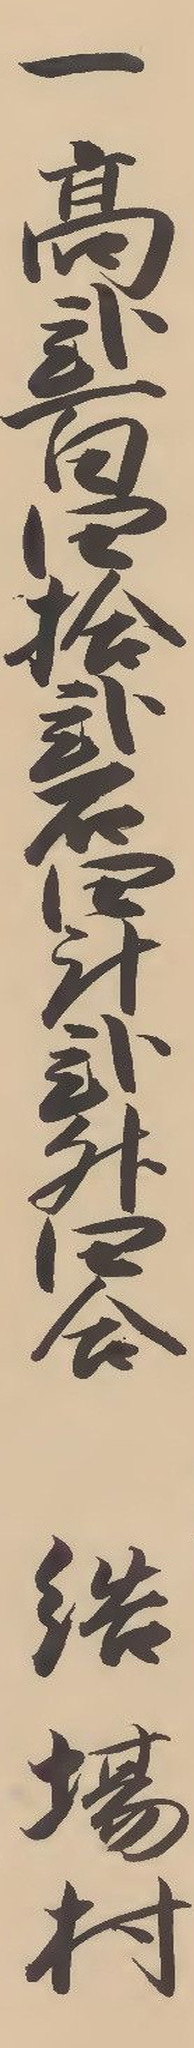一高弐百四拾弐石四斗弐升四合結場村
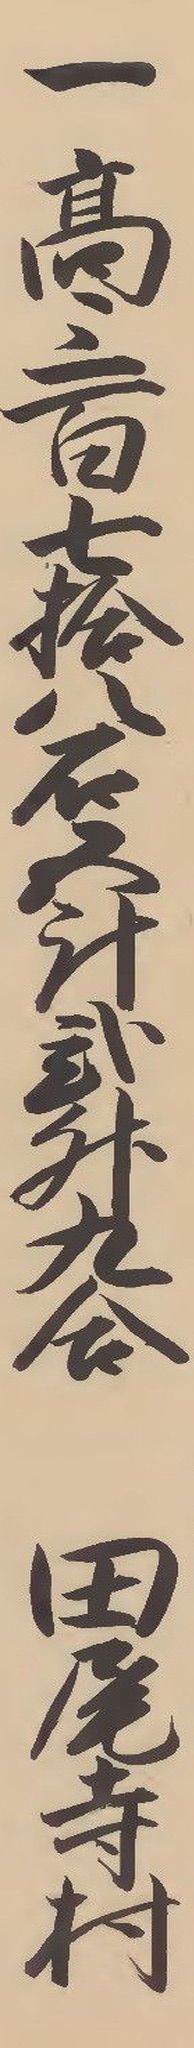一高三百七拾八石五斗弐升九合田尾寺村
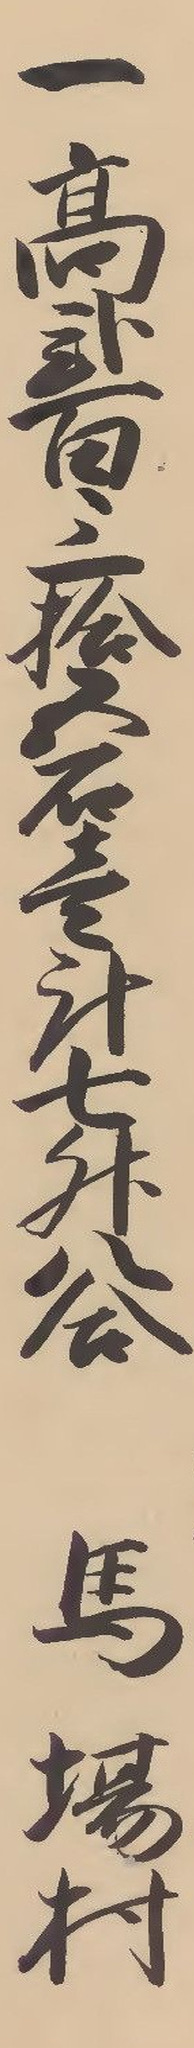一高弐百三拾五石壱斗七升八合馬場村

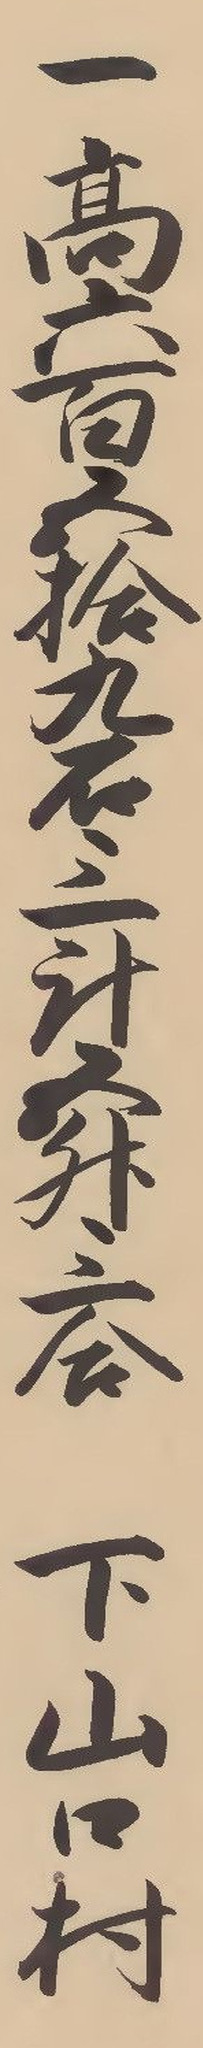一高六百五拾九石三斗五升三合下山口村
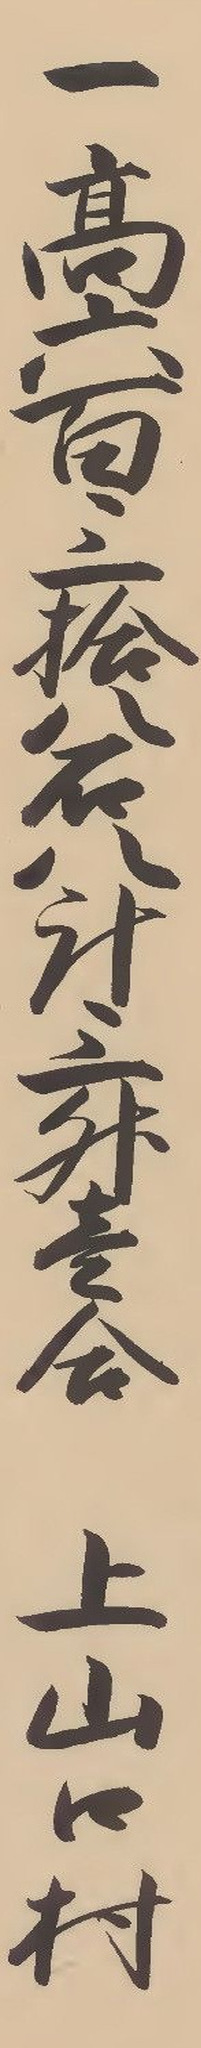一高六百三拾八石八斗三升壱合上山口村
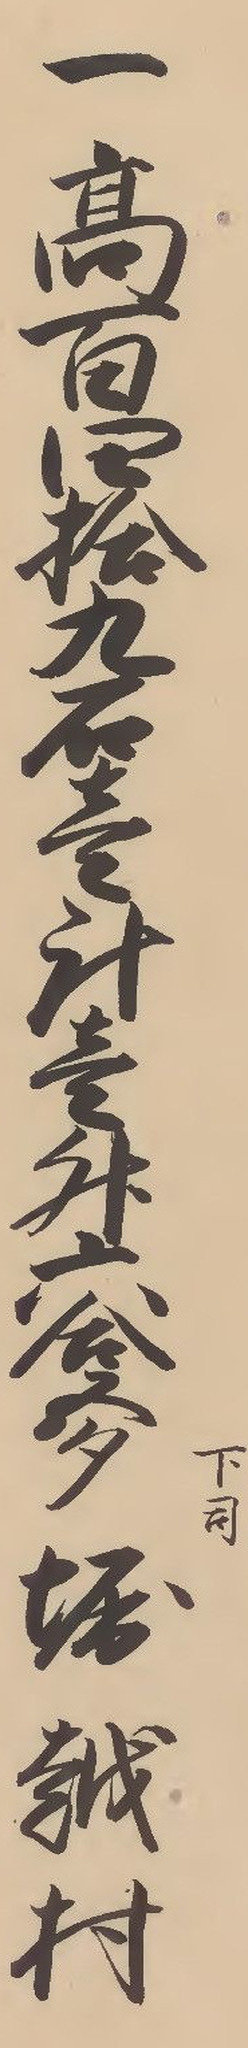一高百四拾九石壱斗壱升六合五勺堀越村
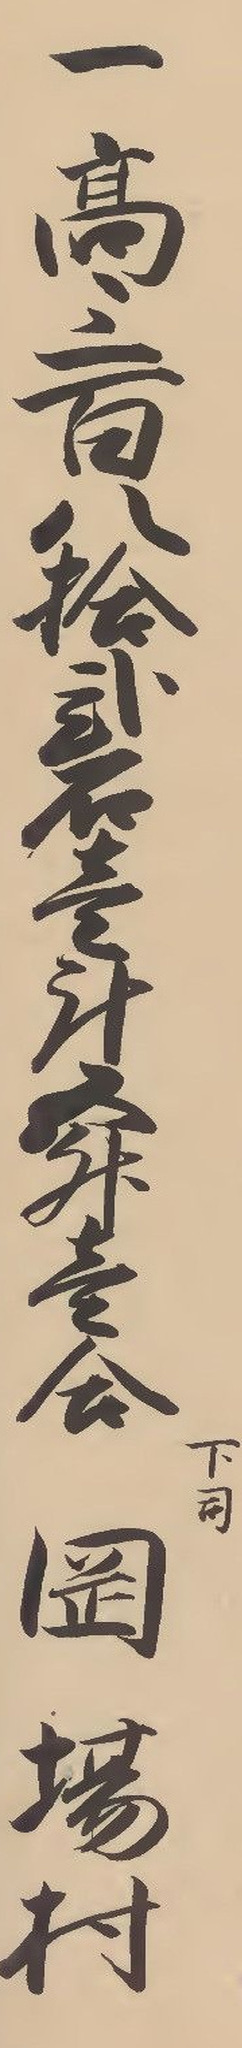一高三百八拾弐石壱斗五升壱合岡場村
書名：摂津国郷帳
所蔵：国立公文書館 National Archives of Japan
